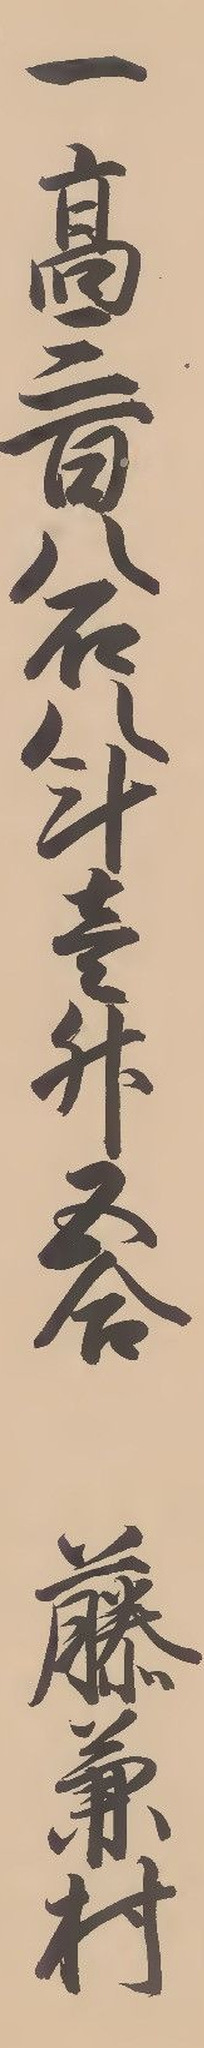一高三百八石八斗壱升五合藤兼村
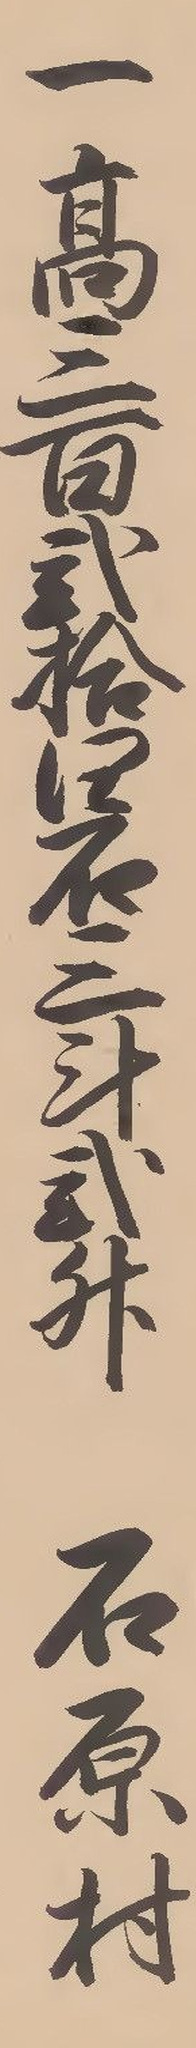一高三百弐拾四石三斗弐升石原村
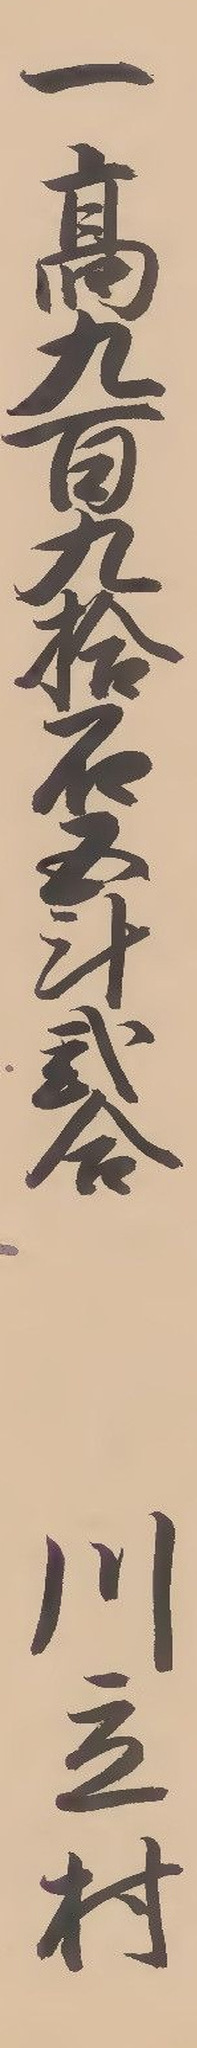一高九百九拾石五斗弐合川立村

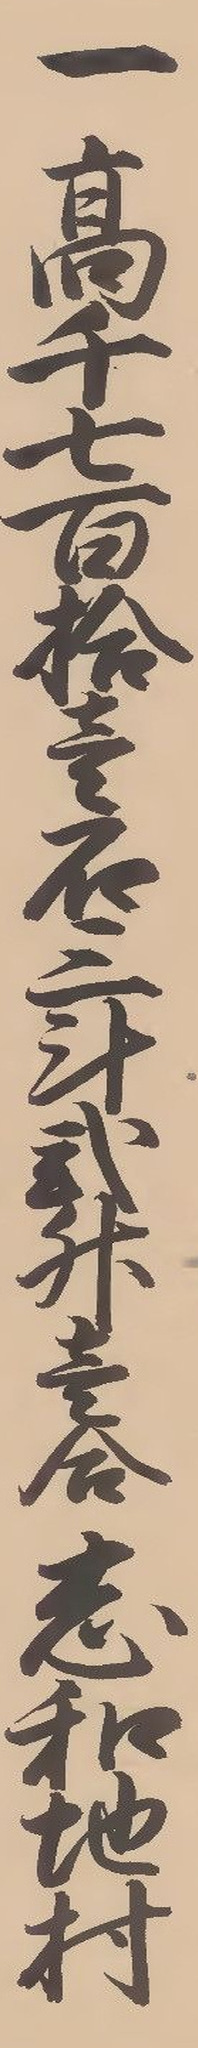一高千七百拾壱石三斗弐升壱合志和地村
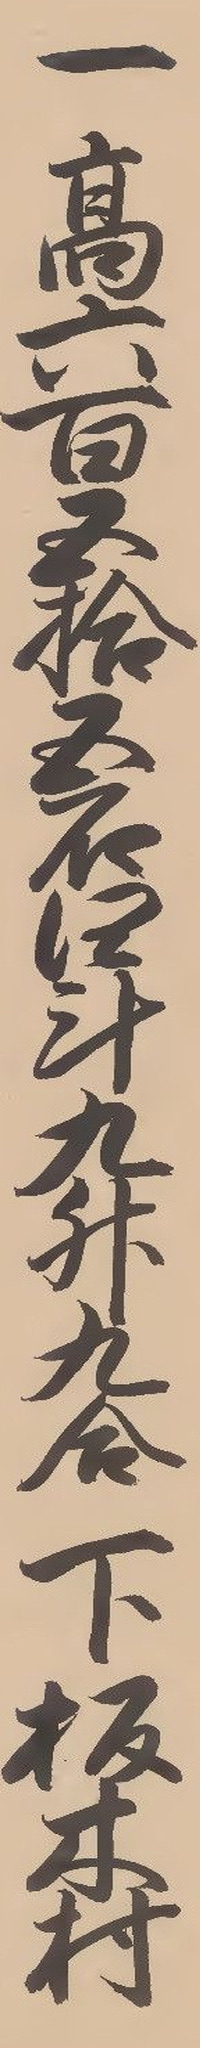一高六百五拾五石四斗九升九合下板木村
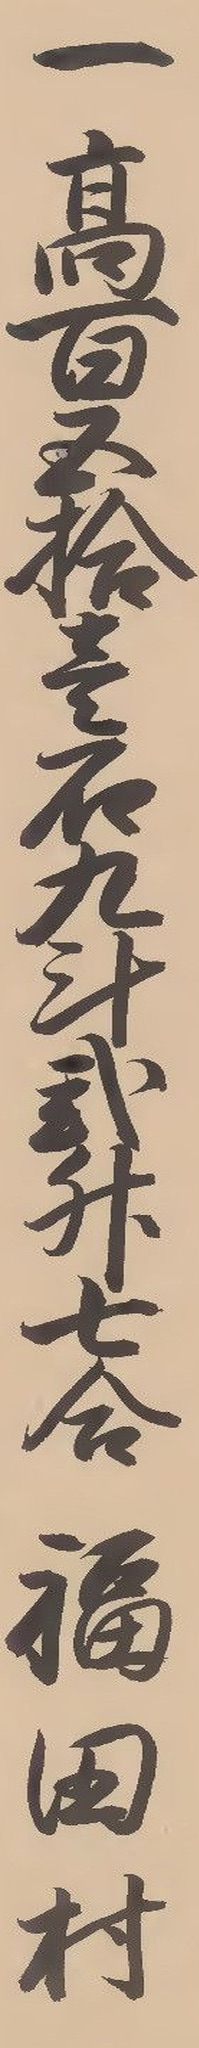一高百五拾壱石九斗弐升七合福田村
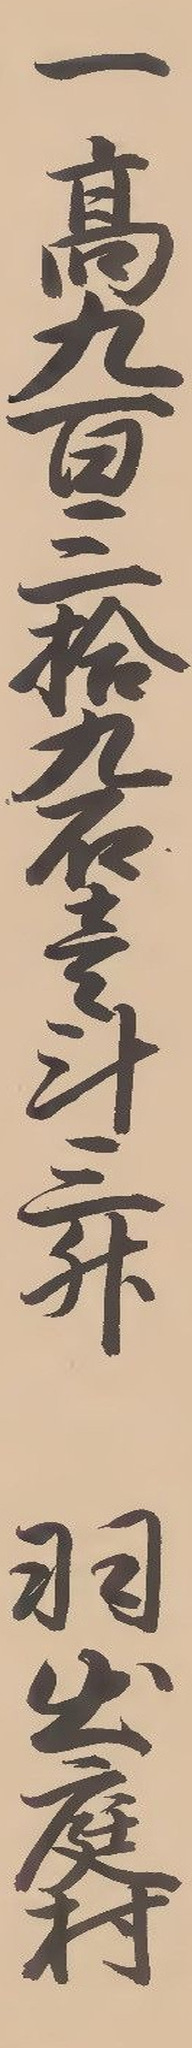一高九百三拾九石壱斗三升羽出庭村
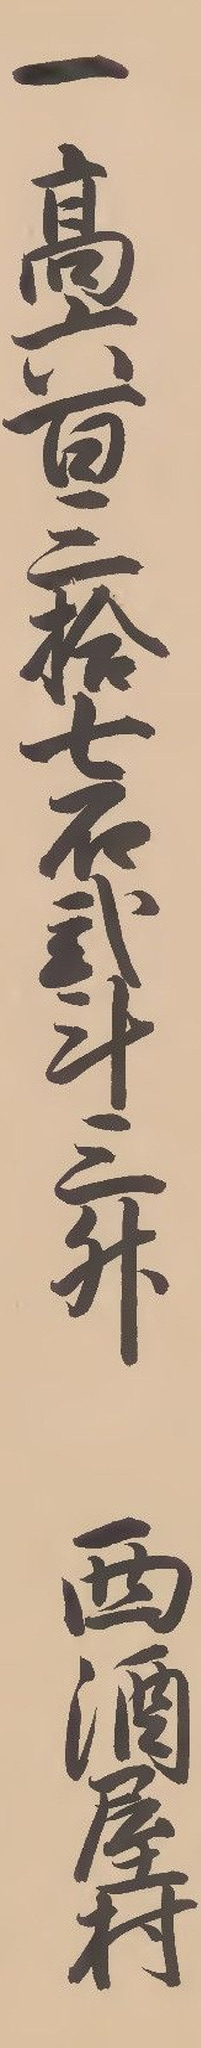一高六百三拾七石弐斗三升西酒屋村
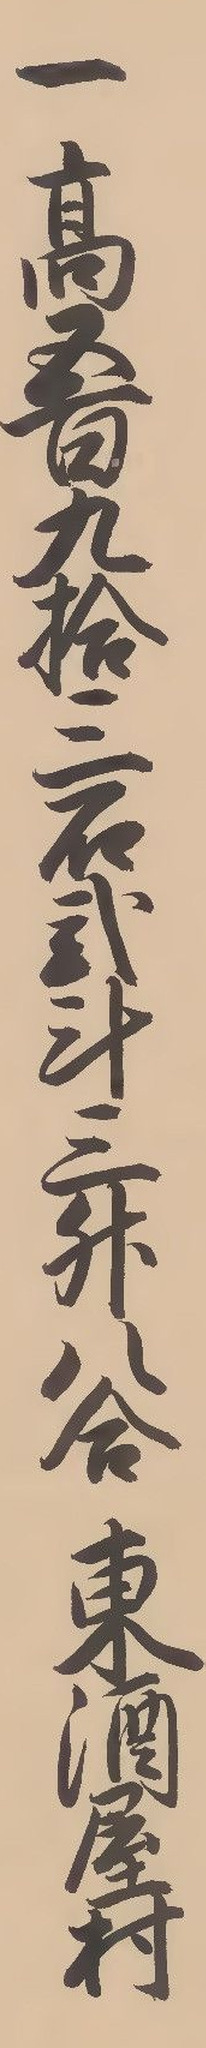一高五百九拾三石弐斗三升八合東酒屋村
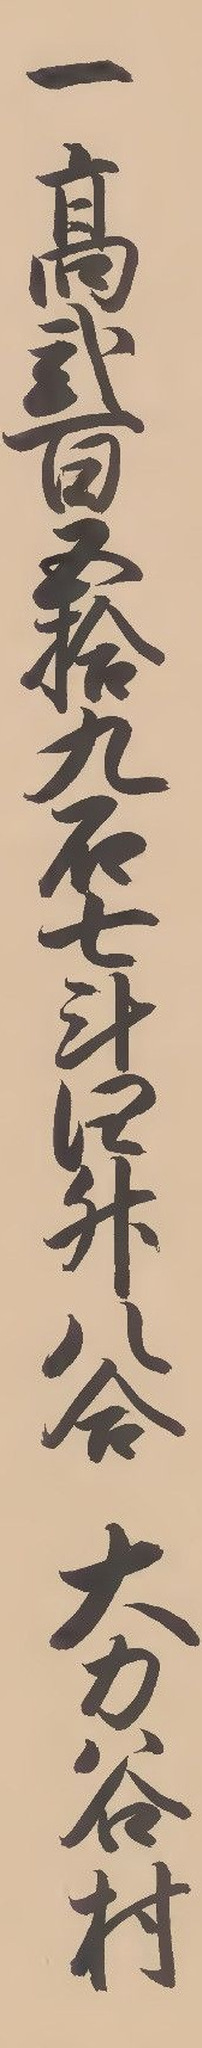一高弐百五拾九石七斗四升八合大力谷村
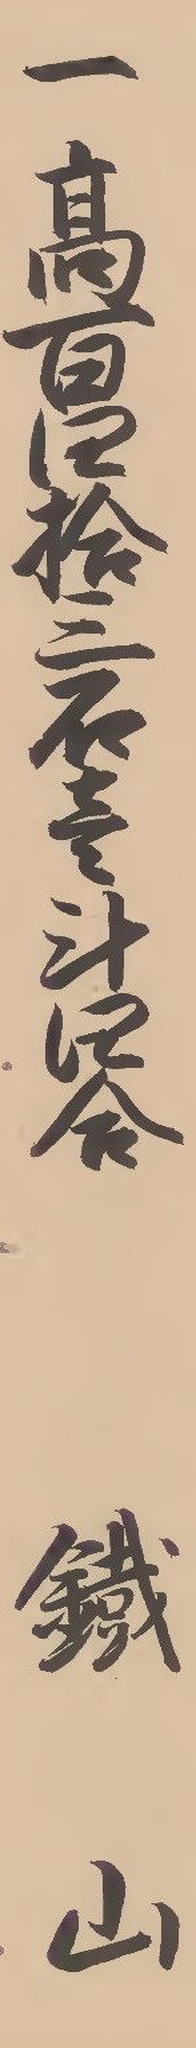一高百四拾三石壱斗四合鉄山

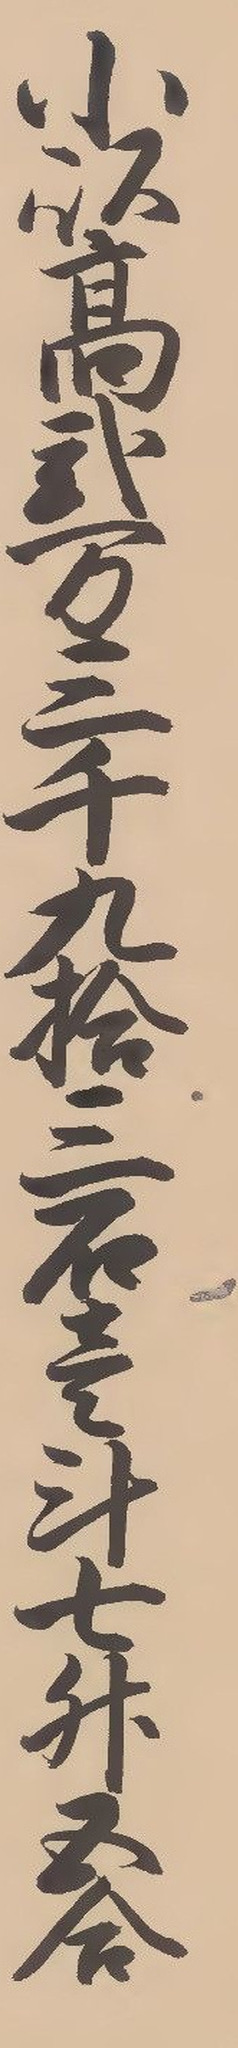小以高弐万三千九拾三石壱斗七升五合
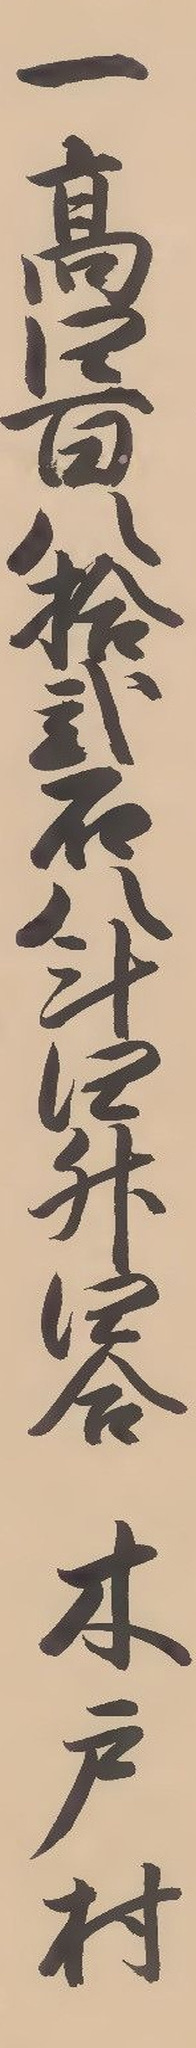一高四百八拾弐石八斗四升四合木戸村
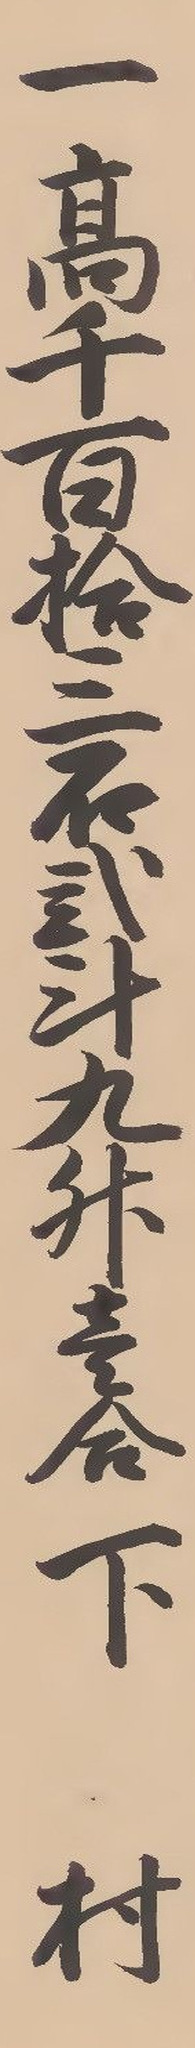一高千百拾三石弐斗九升壱合下村
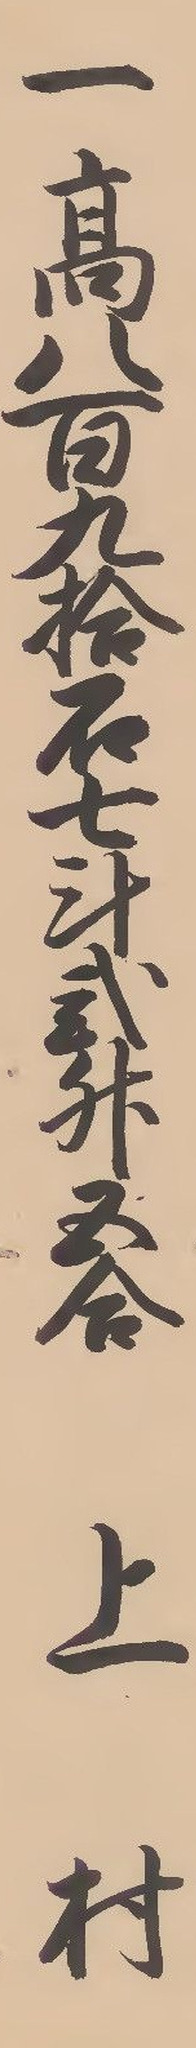一高八百九拾石七斗弐升五合上村

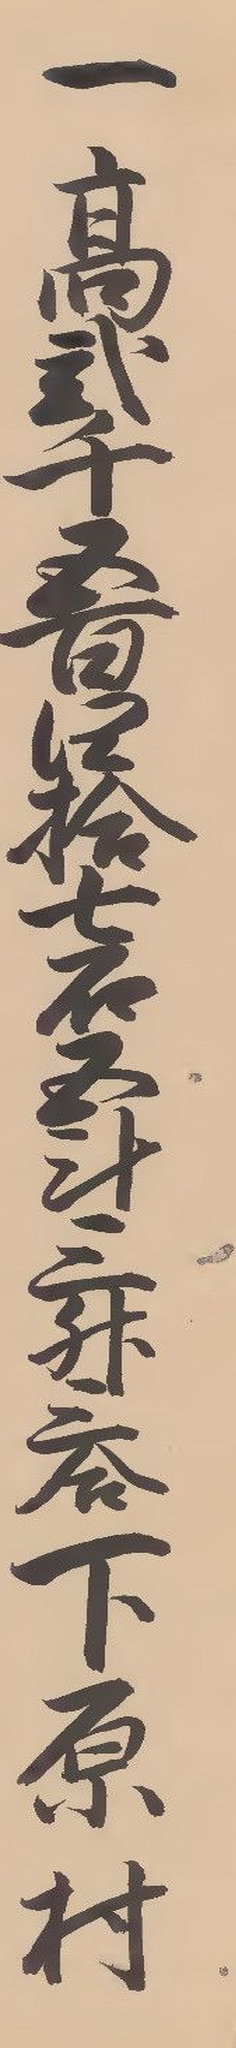一高弐千五百四拾七石五斗三升三合下原村
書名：備後国郷帳
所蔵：国立公文書館 National Archives of Japan
